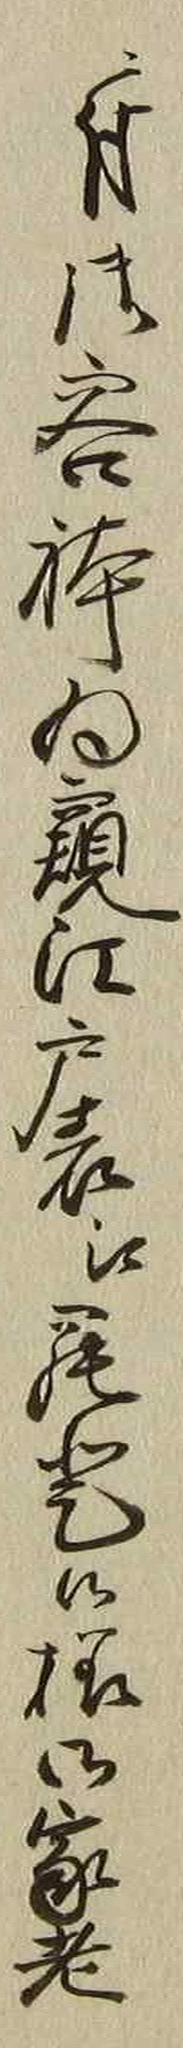ニ付御容躰為窺江戸表江罷登候様御家老
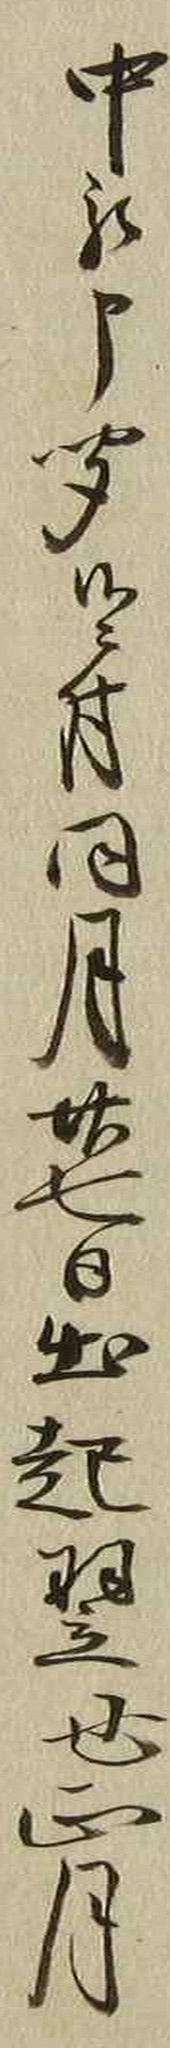中被申聞候ニ付同月廿七日出起翌丑正月
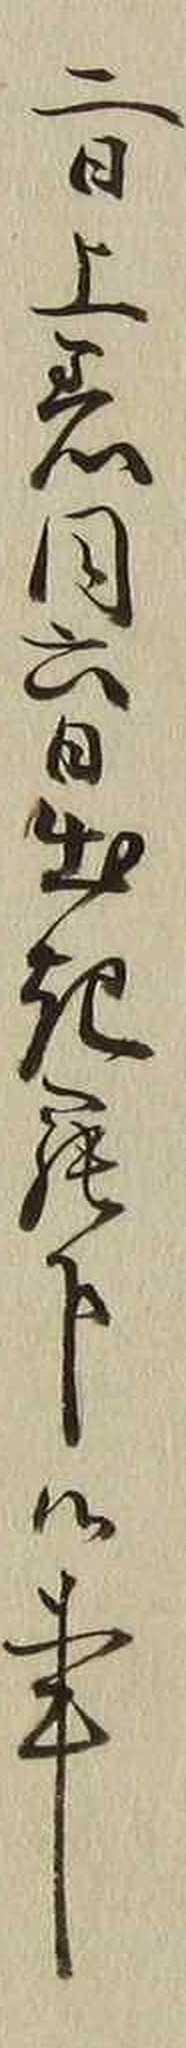二日上着同六日出起罷下候事
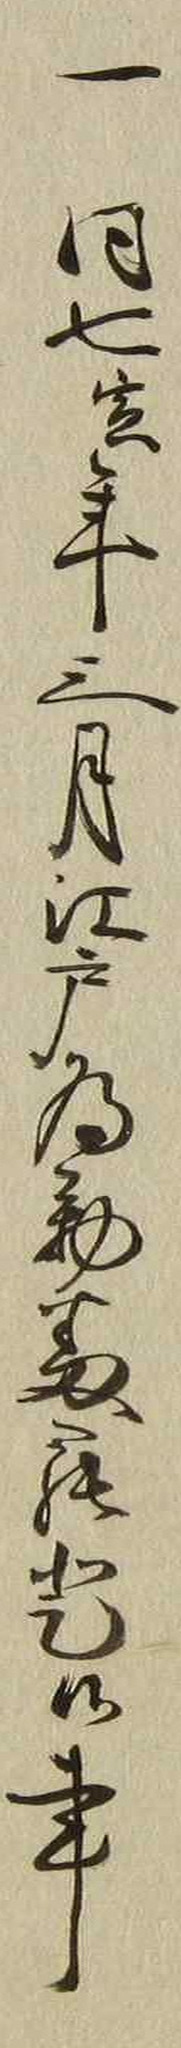一同七寅年三月江戸為勤番罷登候事
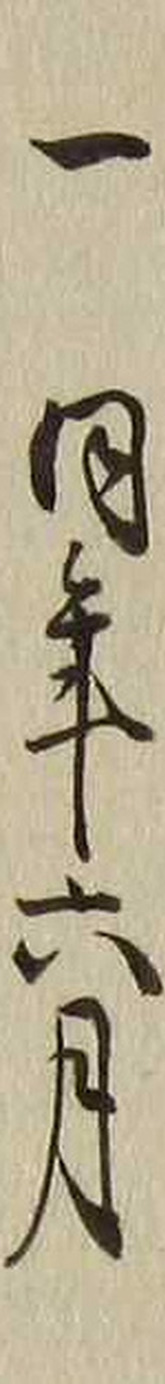一同年六月
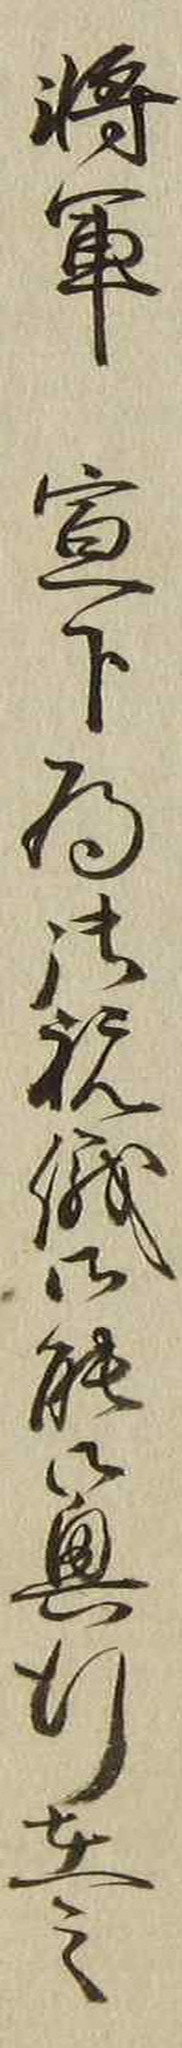将軍宣下為御祝儀御能御奥行在之
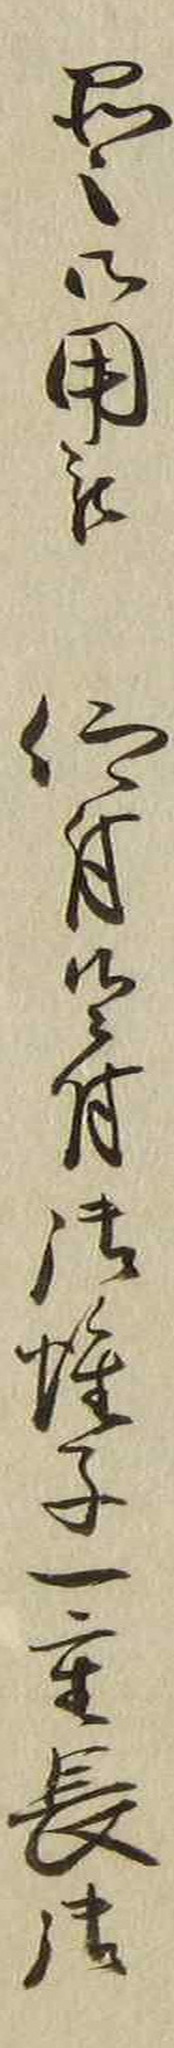品々御用被仰付候ニ付御帷子一重長御
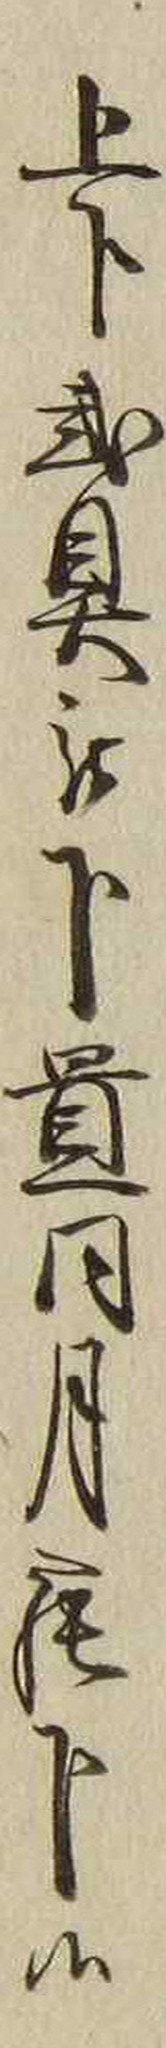上下武具被下置同月罷下候
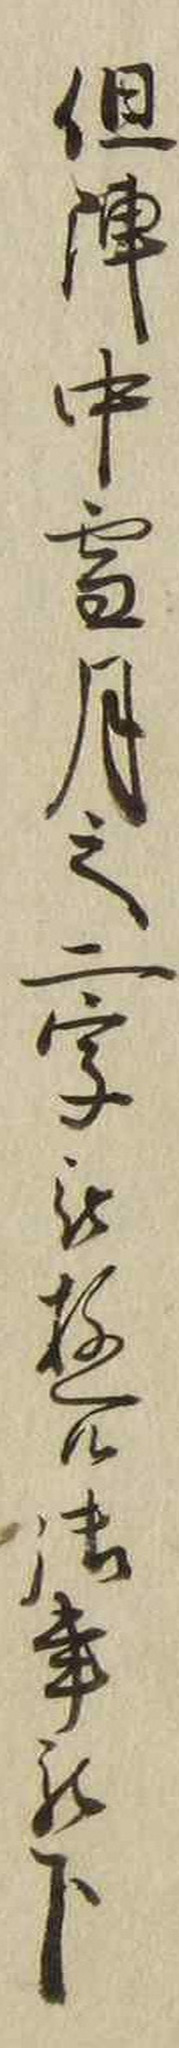但陣中雪月之二字被遊候御事被下

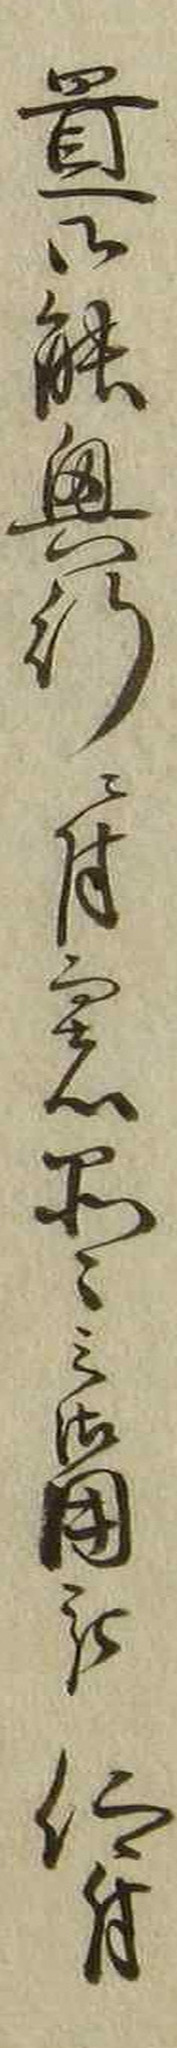置御能奥行ニ付而者品々之御用被仰付
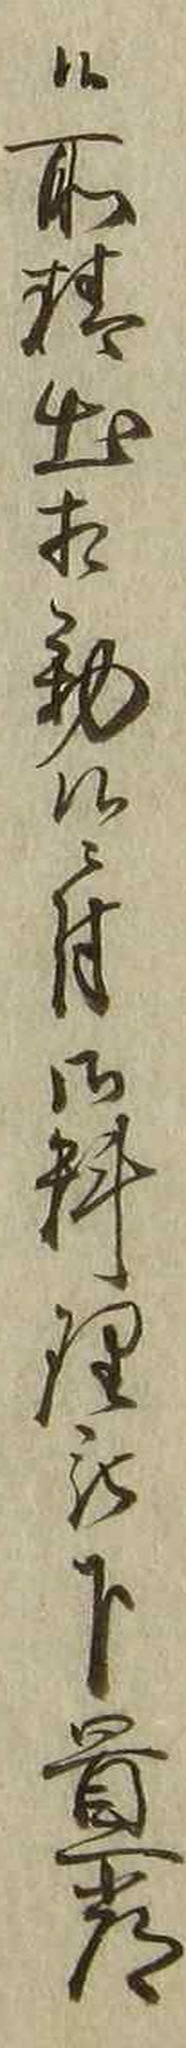候所精出相勤候ニ付御料理被下置常
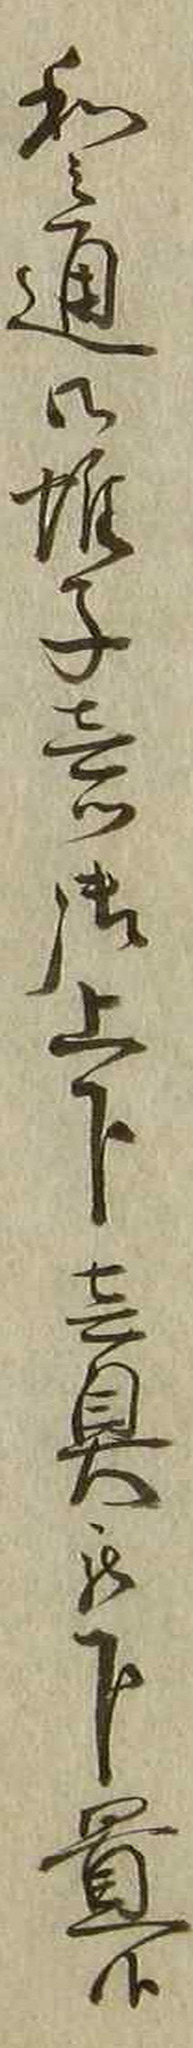和之通御帷子一ツ御上下壱具被下置候
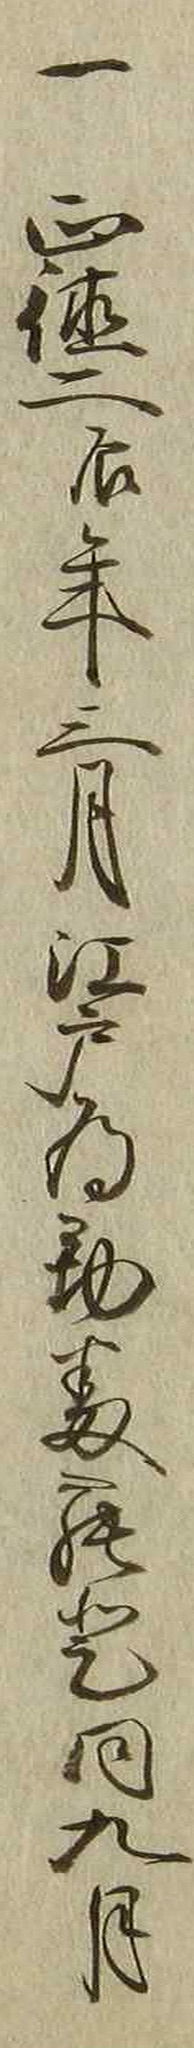一正徳二辰年三月江戸為勤番罷登同九月
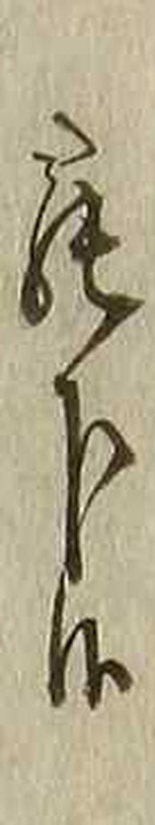罷下候
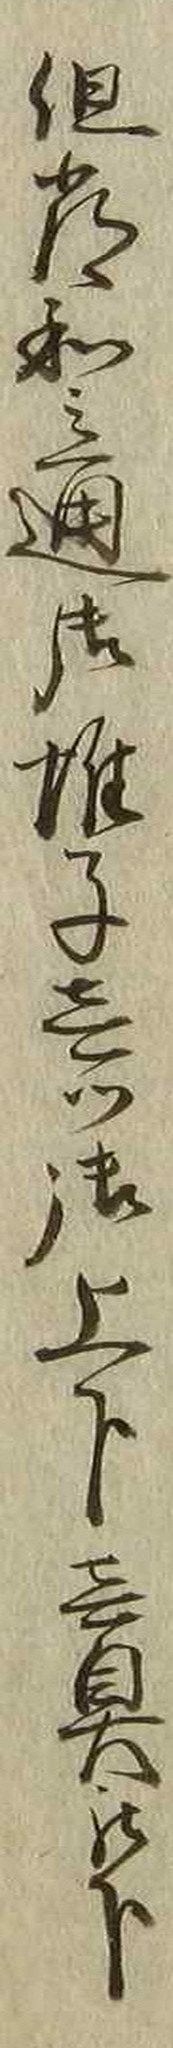但常和之通御帷子壱ツ御上下壱具被下
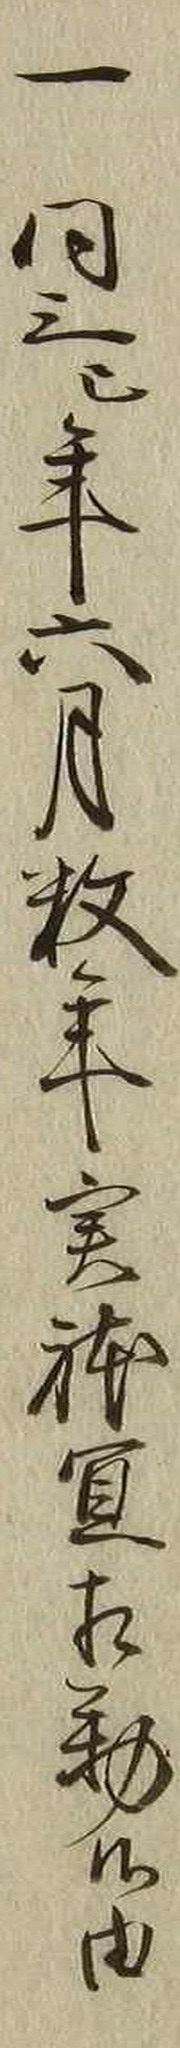一同三巳年六月数年実躰宜相勤候由
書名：諸士系譜　巻之65　ち之部1
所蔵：会津若松市立会津図書館
